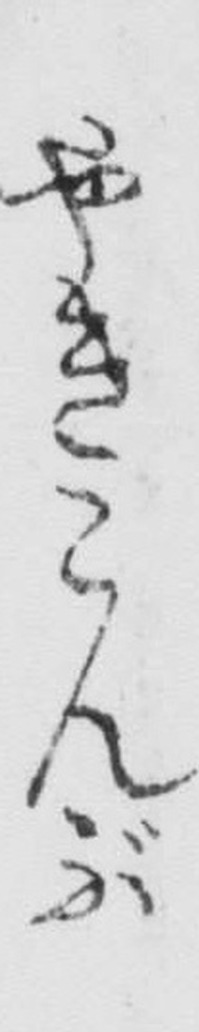やきこんぶ
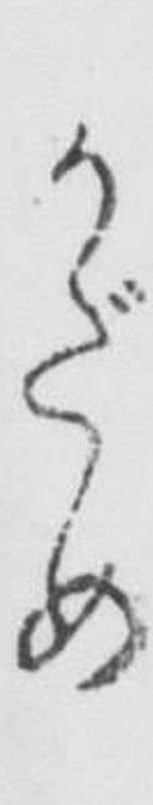かだめ
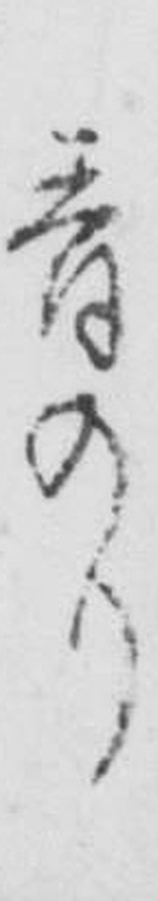青のり

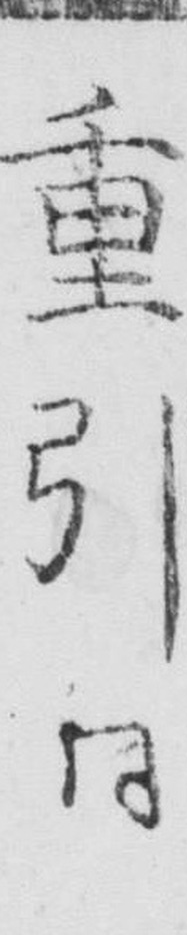重引同
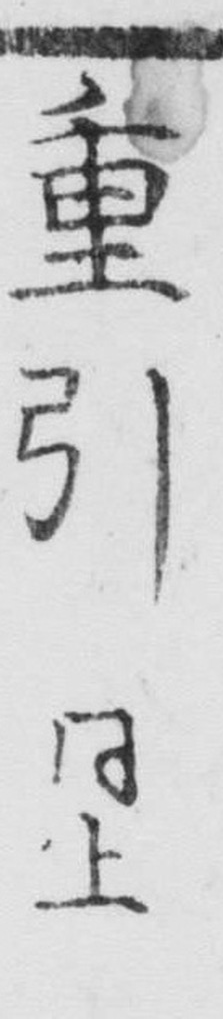重引同上
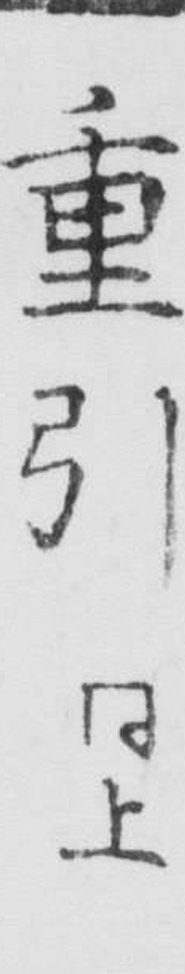重引同上
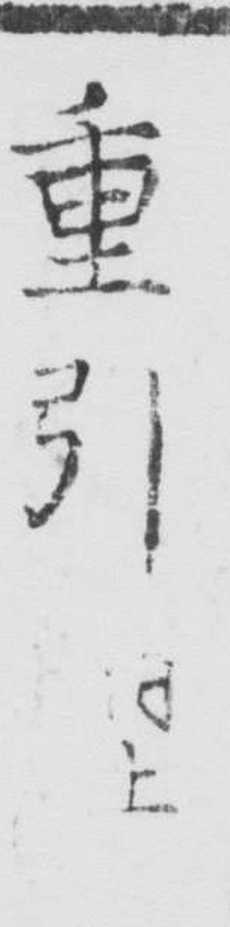重引同
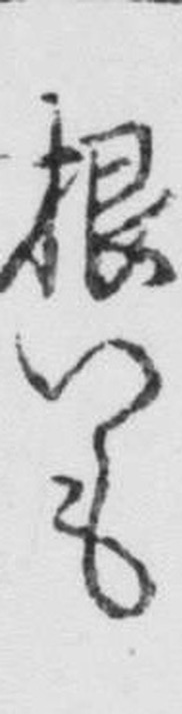根いも
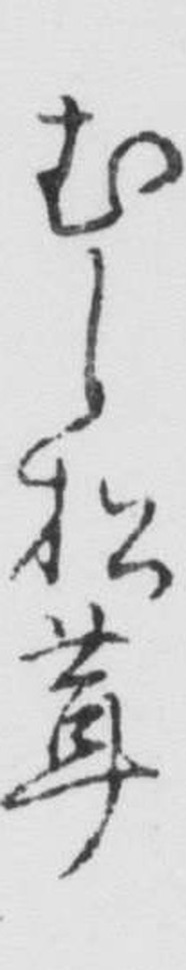むし松茸
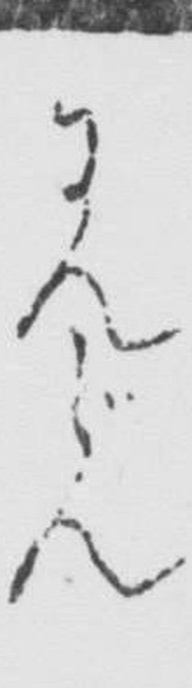にんじん
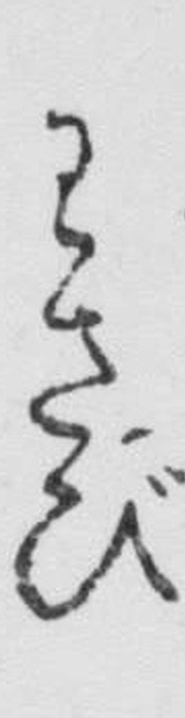わさび
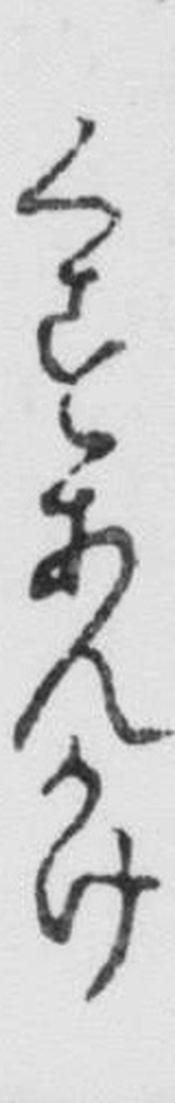くすあんかけ
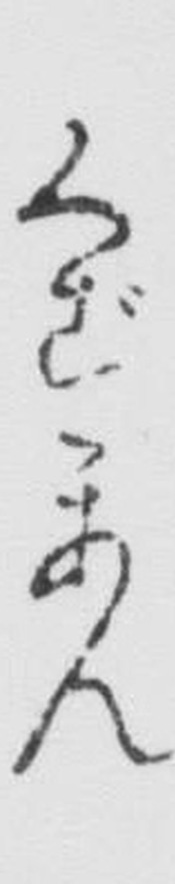くずあん
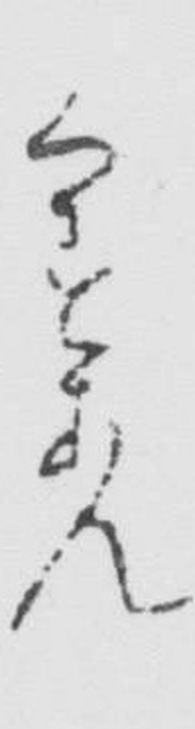くすあん
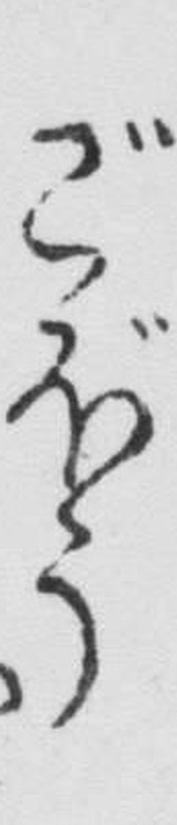ごぼう
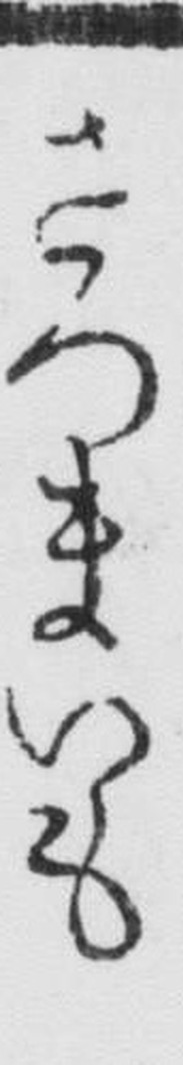さつまいも
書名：諸家通用/即席料理
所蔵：大阪府立大学学術情報センター 国文学研究資料館
